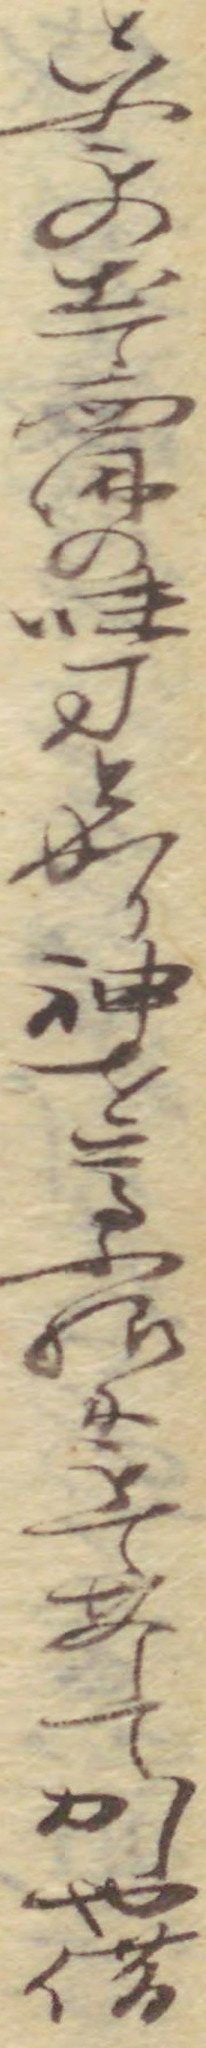といふもの出て西仏の味方と成り神を尊ふ様にもてなしてかしや借
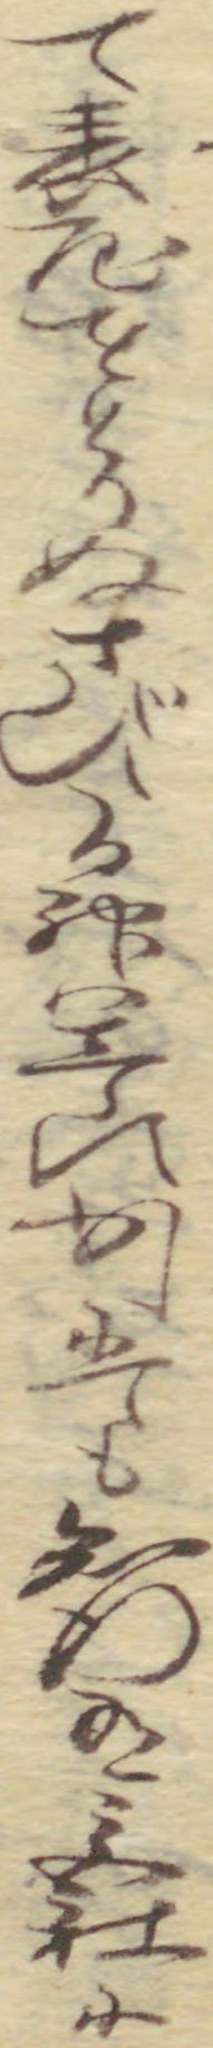て表屋をとりぬさびたる神はしらす少しにても知行有宮社に
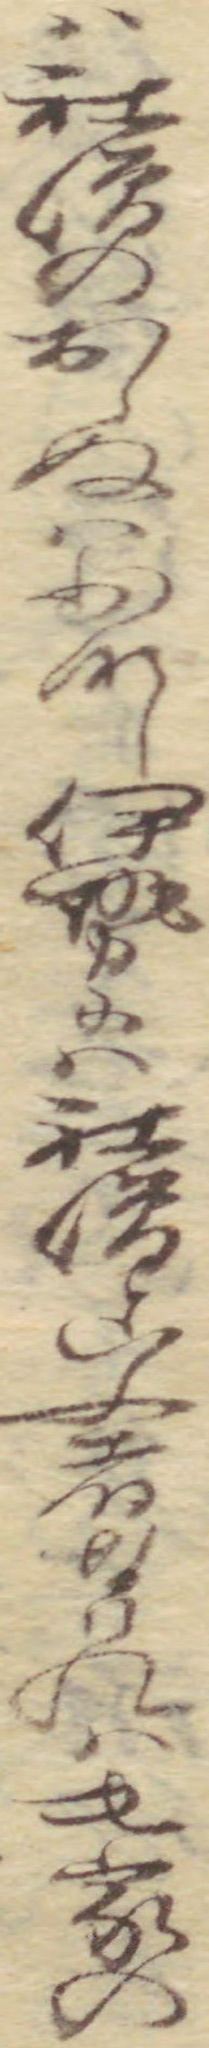は社僧のおらぬは少なし伊勢には社僧といふ者なけれは出家の
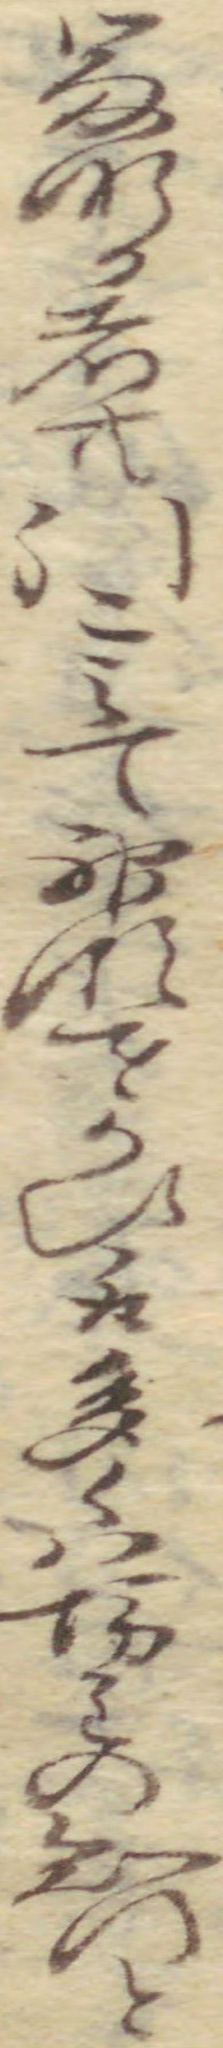富なる者共引こみて神領をかひ取多くは坊主の知行と
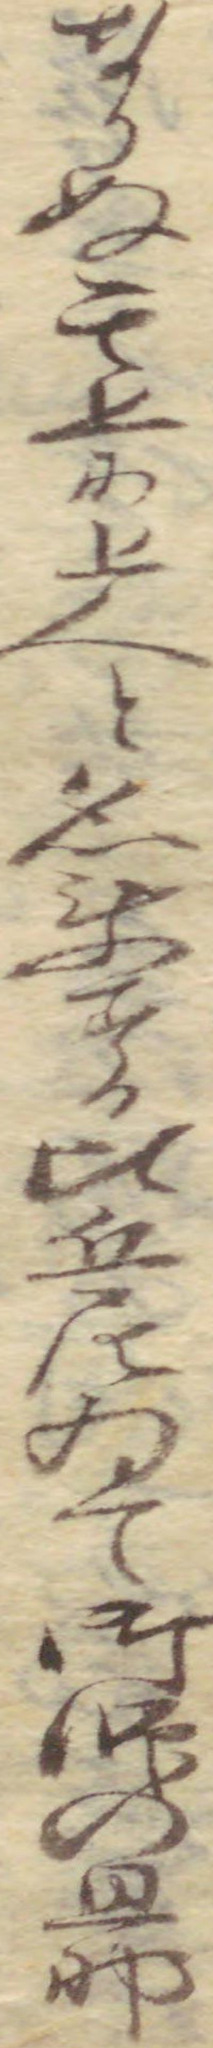なりぬ其上に上人と名乗する比丘尼ゐて御師の旦那
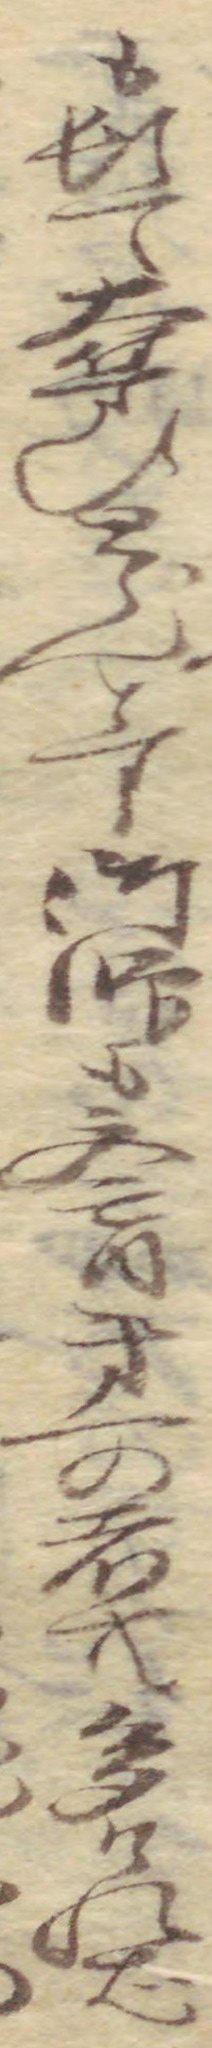も頓て奪ひとらんとす御師も文盲第一の者共多ければ
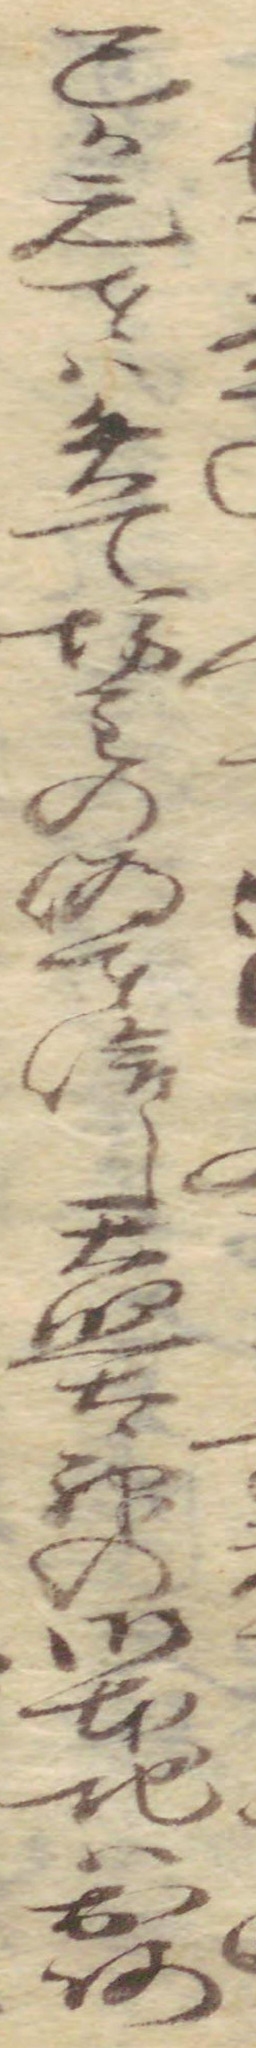己か元をは失て坊主の偽を信し天照太神の御本地はおあ
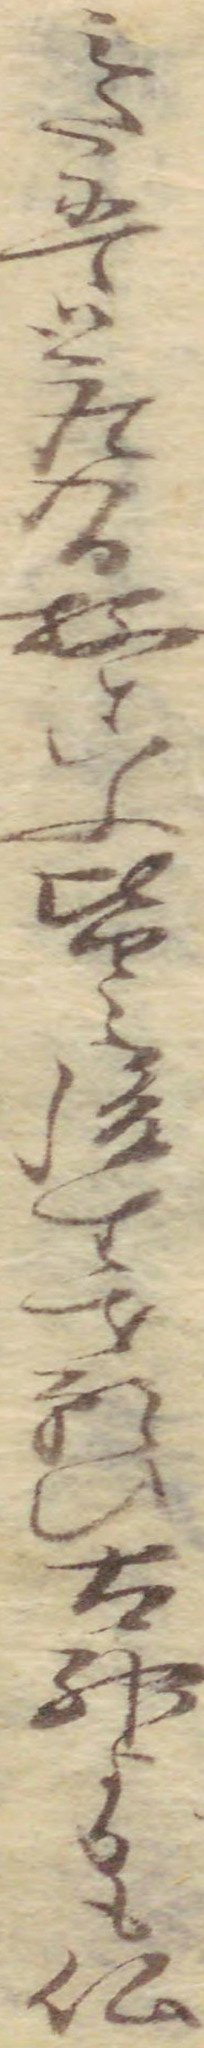みたにて御座有抔といふ皆〻後生を願ひ太神よりも仏
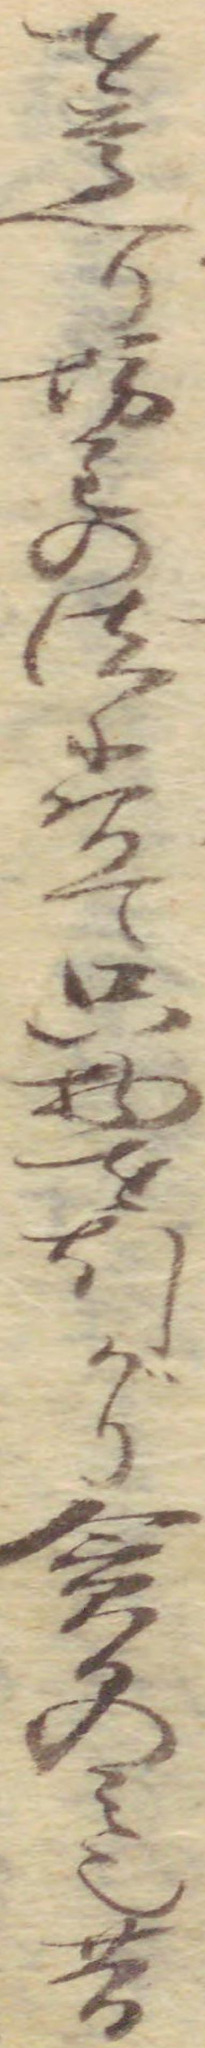を尊へり坊主の法に習て只物をほしかり貪るのみ也昔
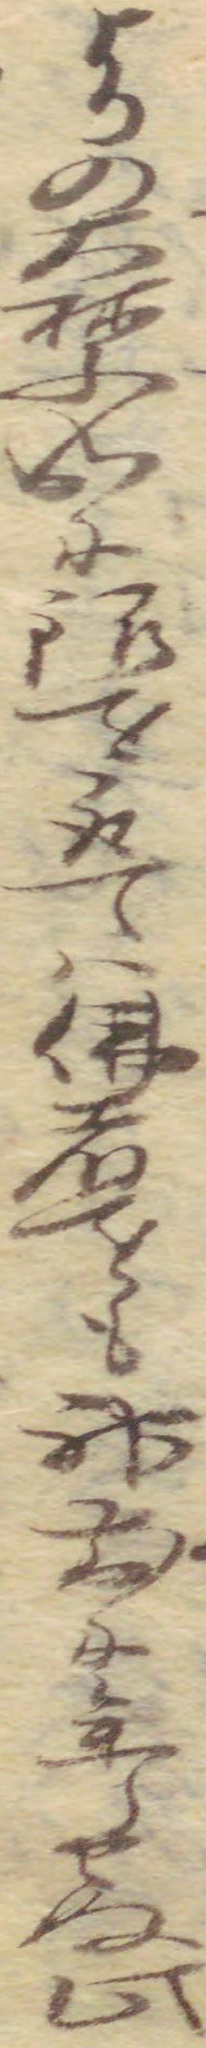よりの大禁成に銀を取ては仏者をも神前に参らせぬ此
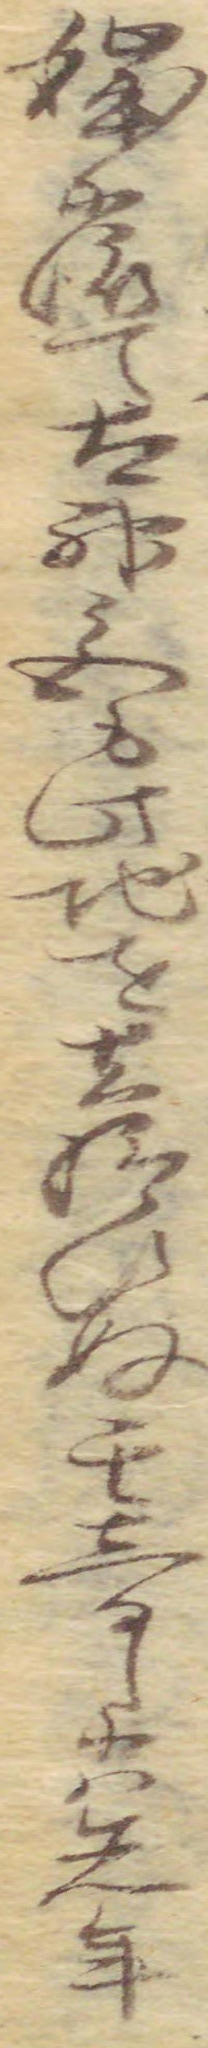穢に依て太神宮も此地を去給ひぬ其しるしには先年

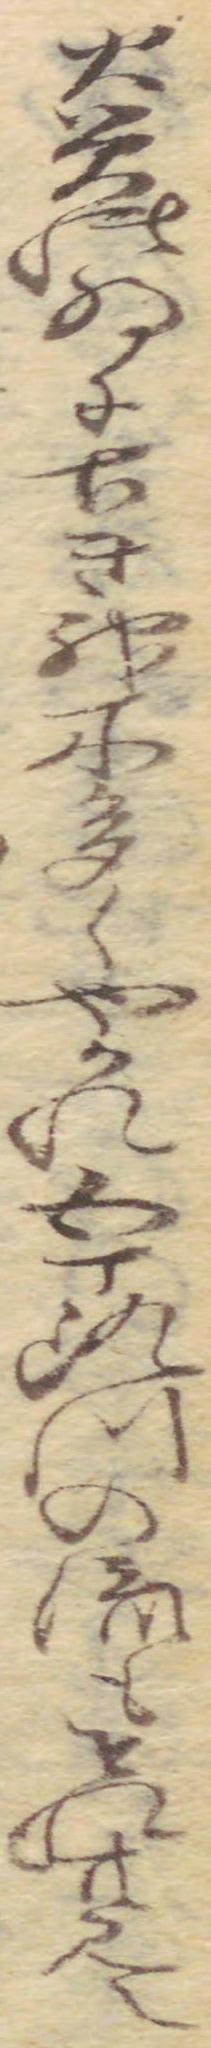火災の為に古き神木多くやかれ五十鈴川の流もそれ共見え
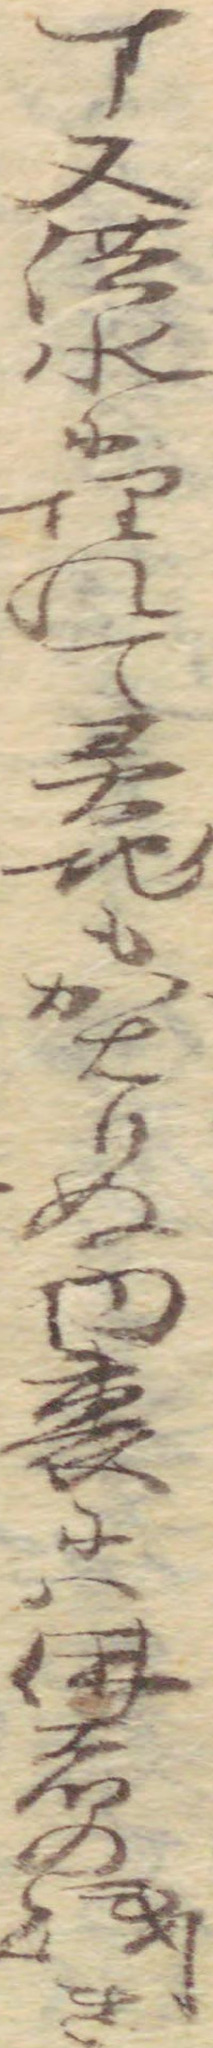すまた洪水に埋れて霊地もかはりぬ内裏には仏者の賎しき
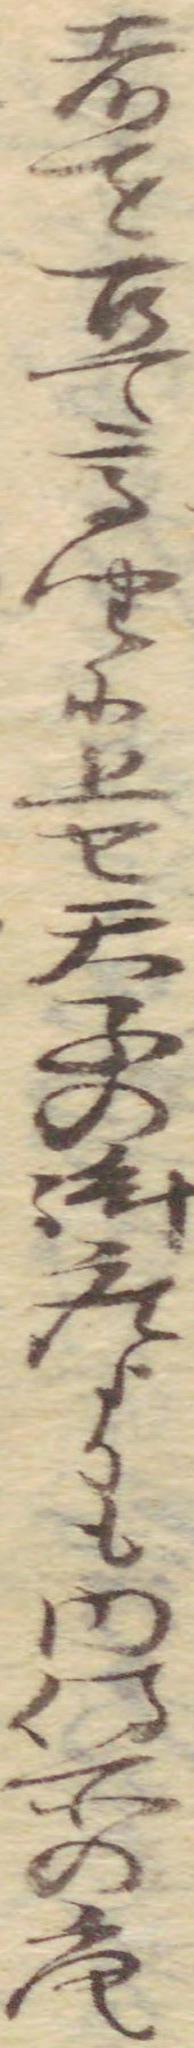者を召て高坐に上せ天子の御座よりも内侍所の唐
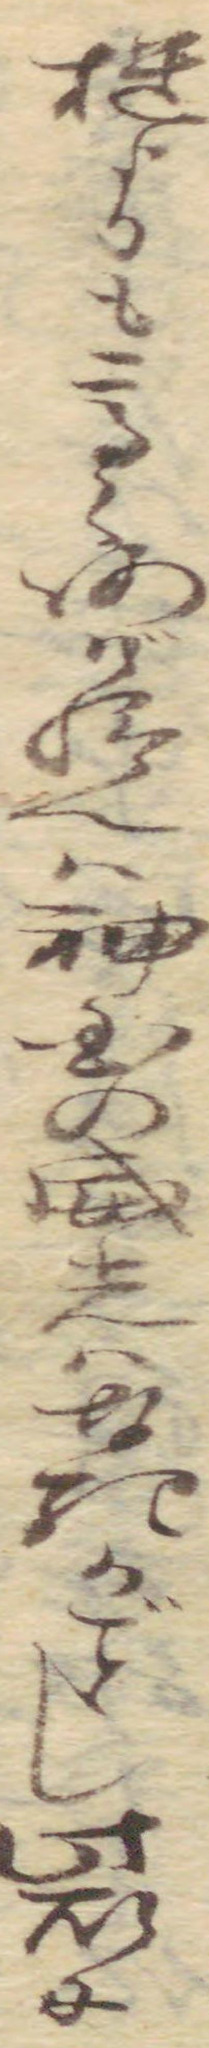櫃よりも高くあげ給へは神国の威光はなきかごとし此故に
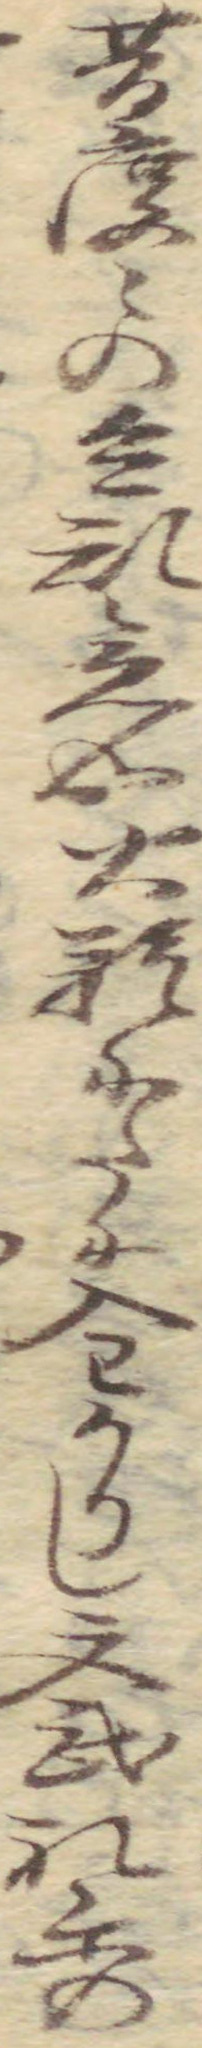昔度〻の兵乱急成火難にたに全かりし文武礼楽の
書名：鶯宿雑記. 巻263-264
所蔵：国立国会図書館 National Diet Library, JAPAN
